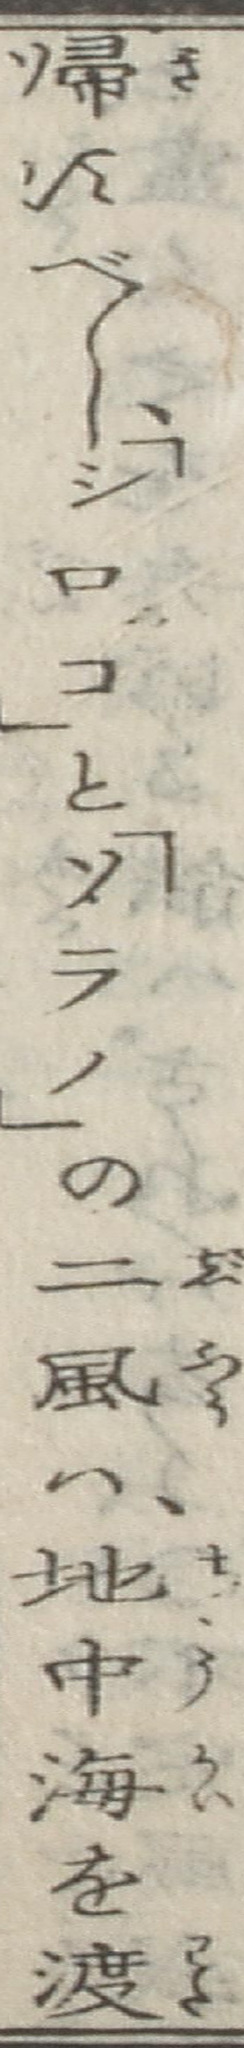帰すべし、「シロコ」と「ソラノ」の二風は、地中海を渡
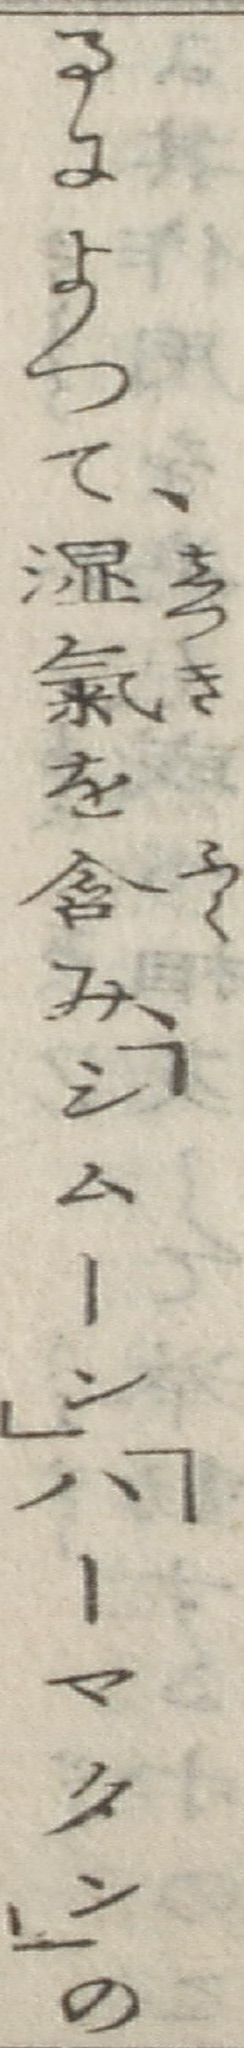るによつて、湿気を含み、「シムーン」「ハーマタン」の
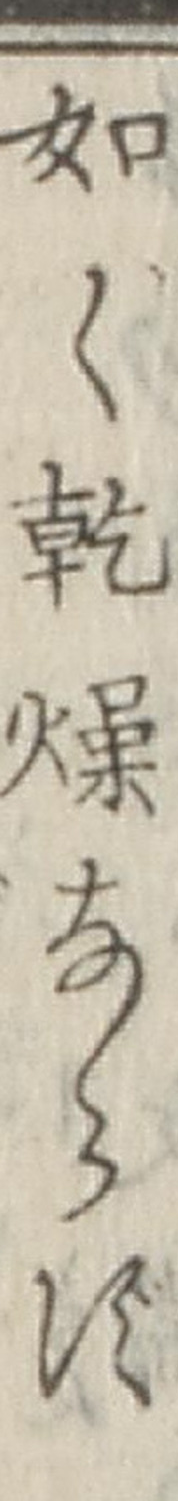如く乾燥ならず
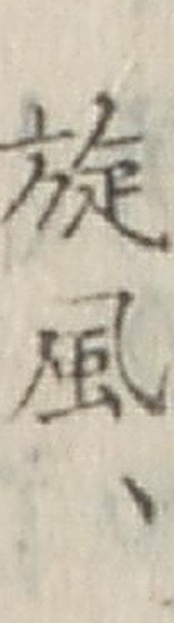旋風、
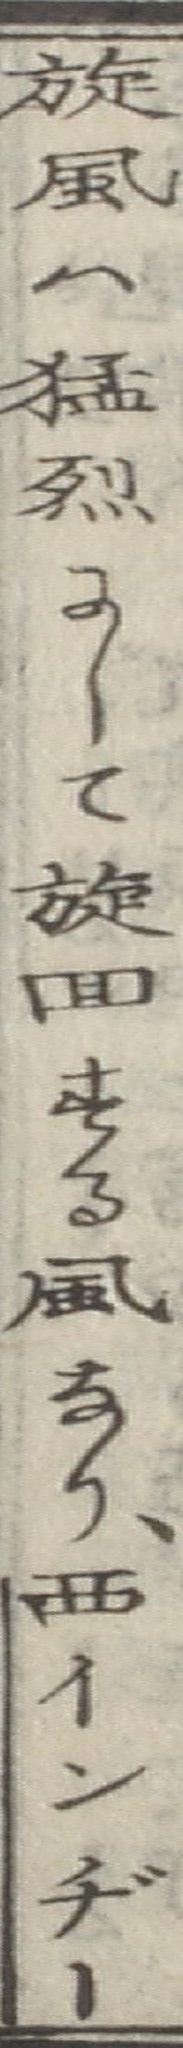旋風は猛烈にして旋回する風なり、西インヂー
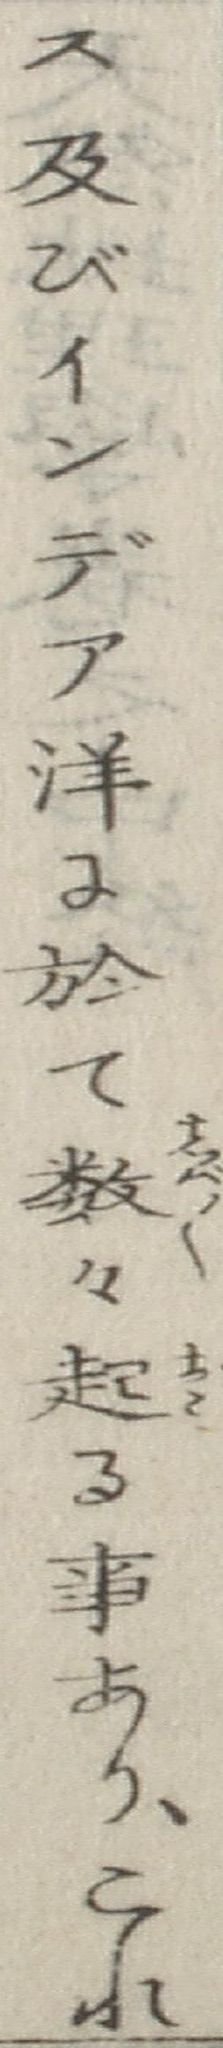ス及びインデア洋に於て数々起る事あり、これ
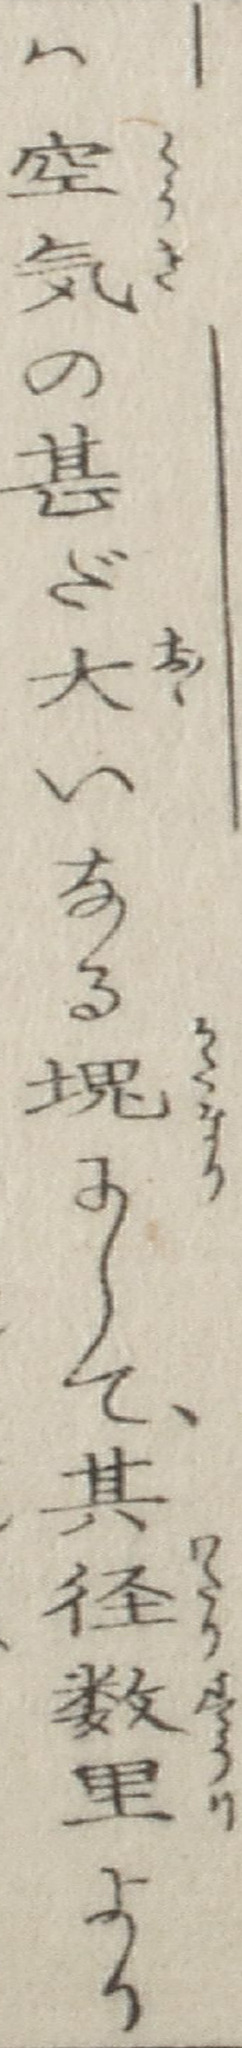は空気の甚だ大いなる塊にして、其径数里より
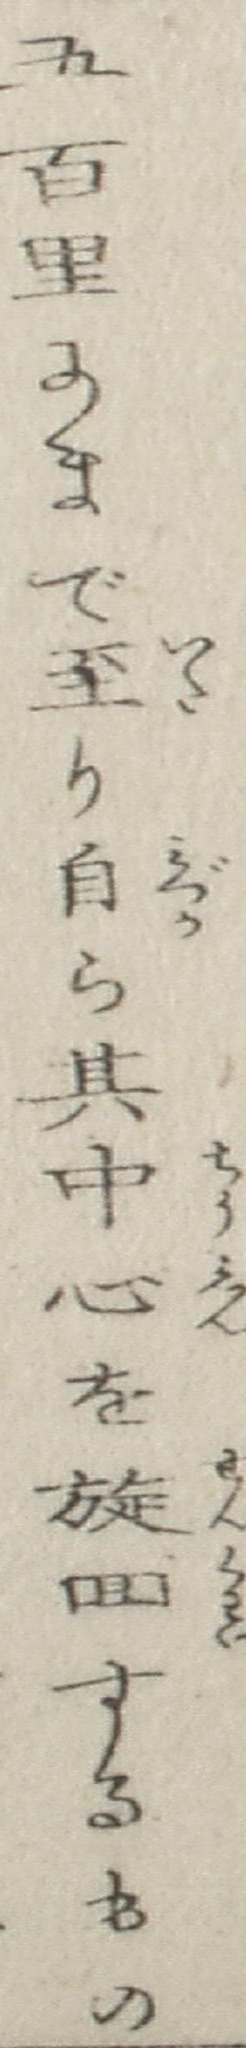五百里にまで至り自ら其中心を旋回するもの
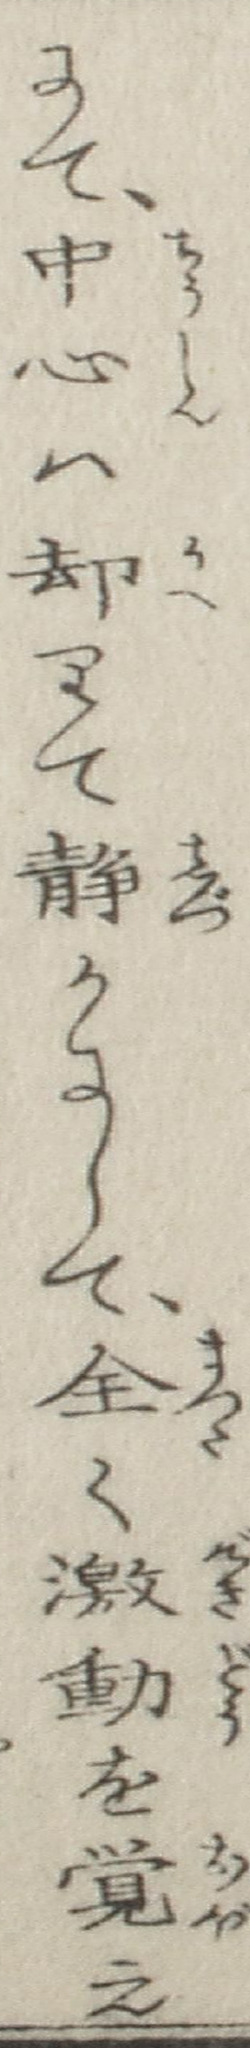にて、中心は却りて静かにして、全く激動を覚え
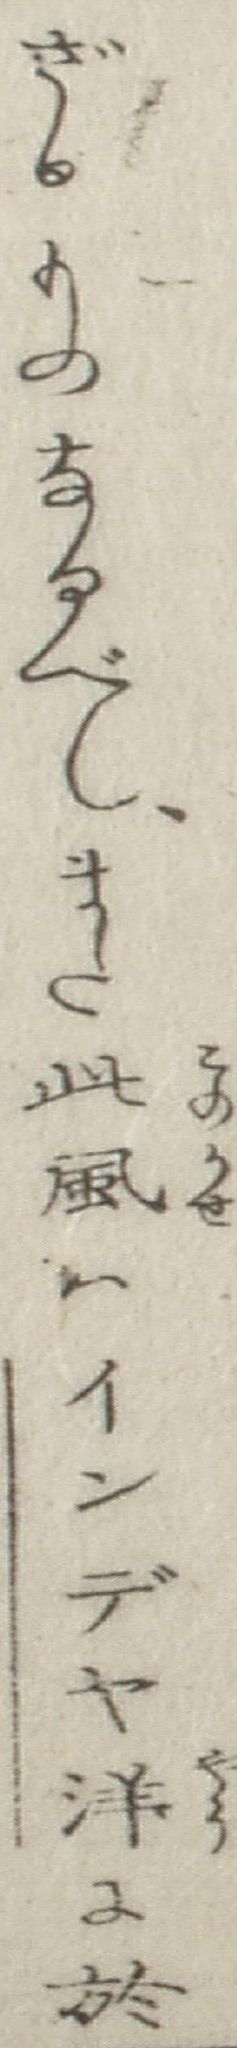ざるものなるべし、また此風はインデヤ洋に於
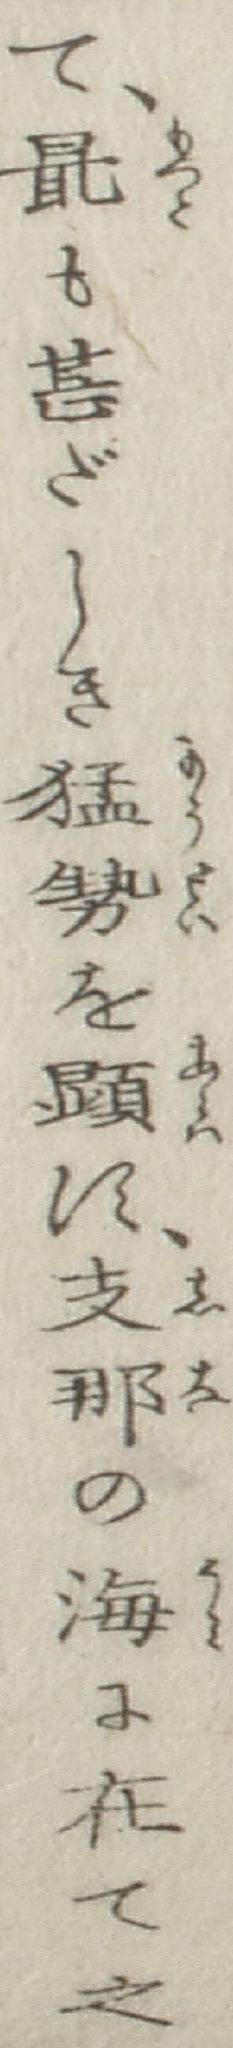て、最も甚だしき猛勢を顕す、支那の海に在て之
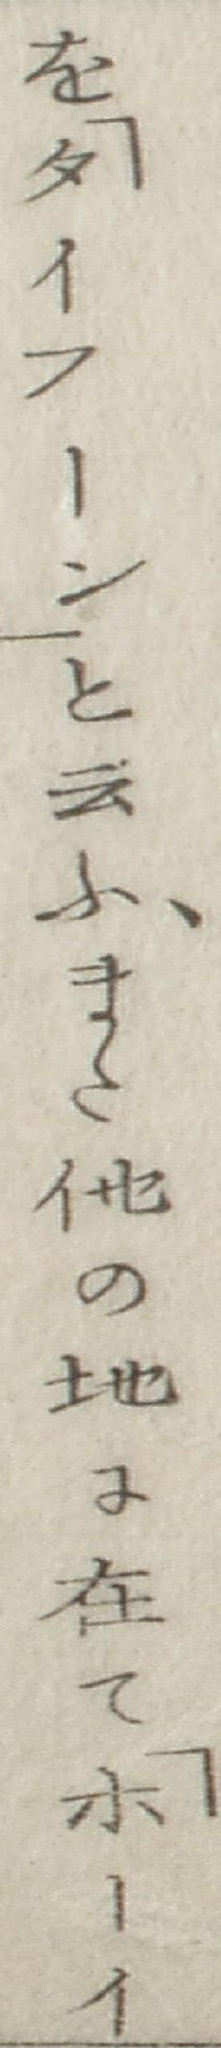を「タイフーン」と云ふ、また他の地に在て「ホーイ
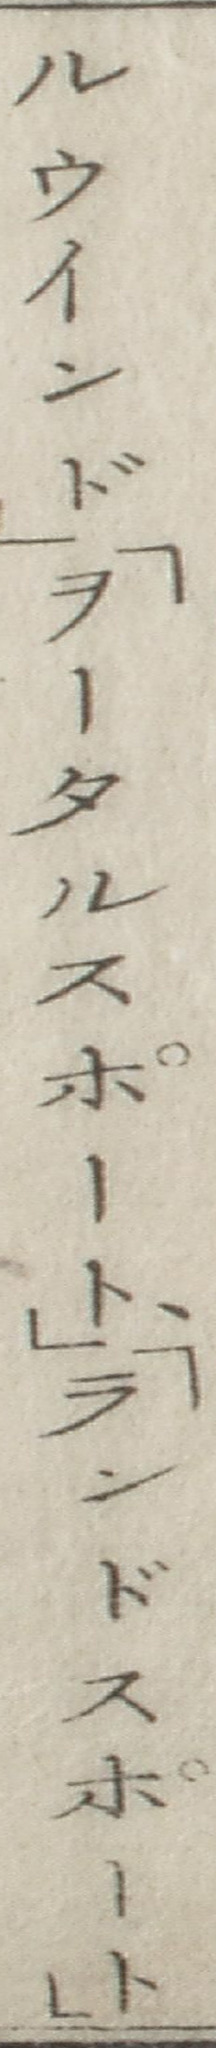ルウインド」「ヨータルスポート、」「ランドスポート」
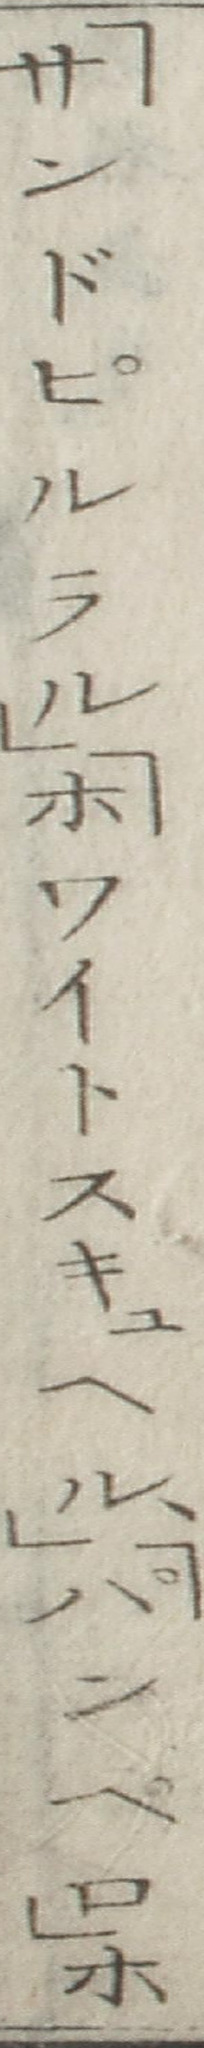「サンドピルラル」「ホワイトスキュヘル、」「パンペロ」等

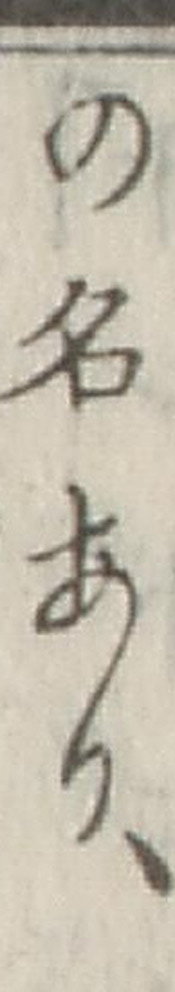の名あり、
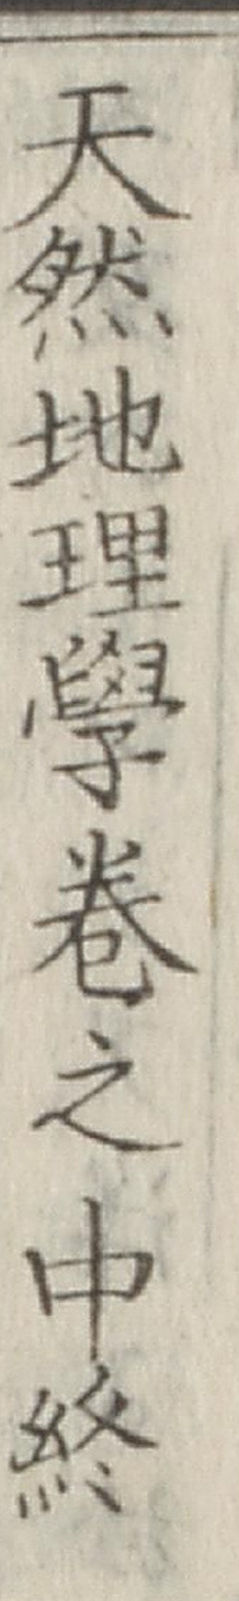天然地理学巻之中終
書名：訓蒙　天然地理學　中
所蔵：東京大学地震研究所図書室 Earthquake Research Institute Library, The University of Tokyo, JAPAN
